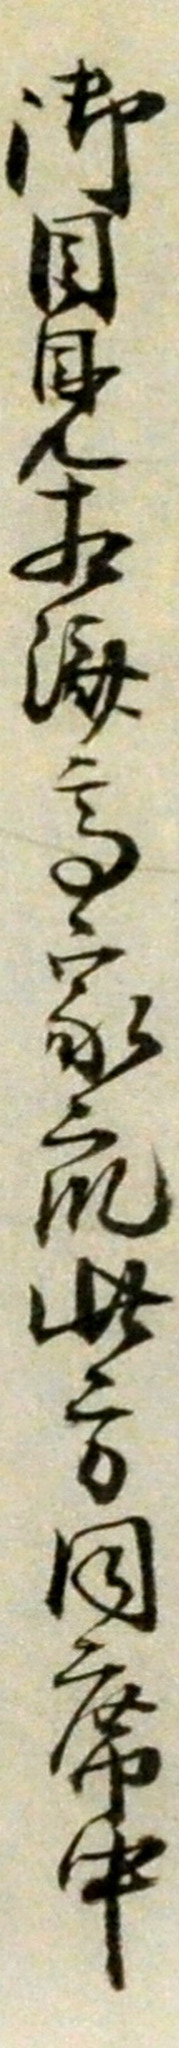御目見相済高家衆此方同席中
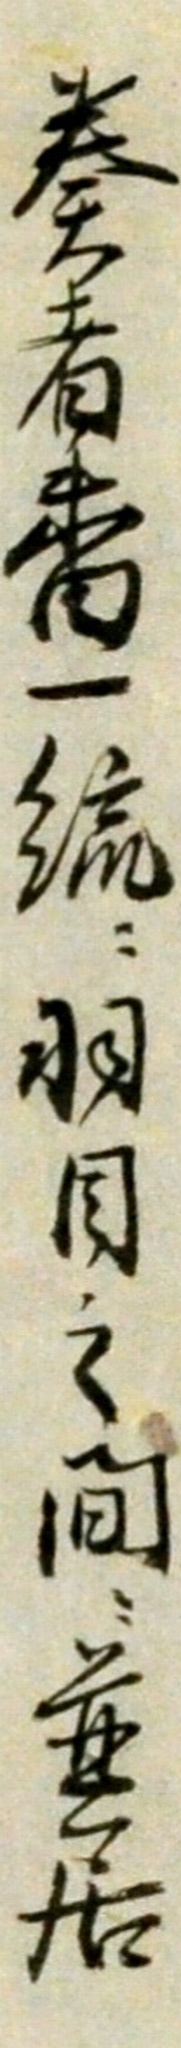奏者番一統に羽目之間に並居
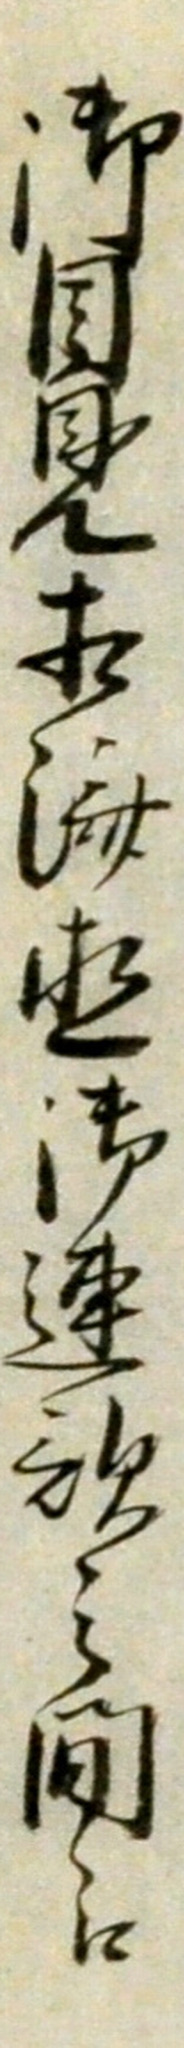御目見相済直御連歌之間え
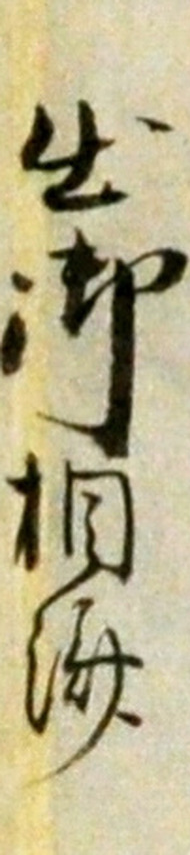出御相済
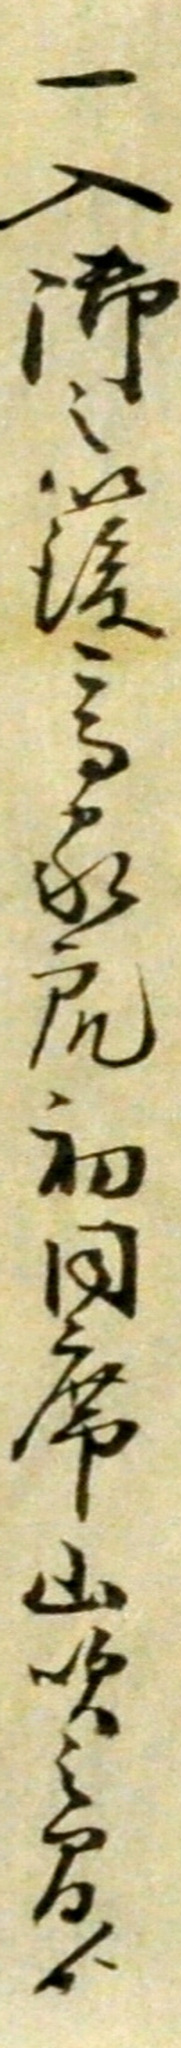一入御之以後高家衆初同席山吹之間ゟ
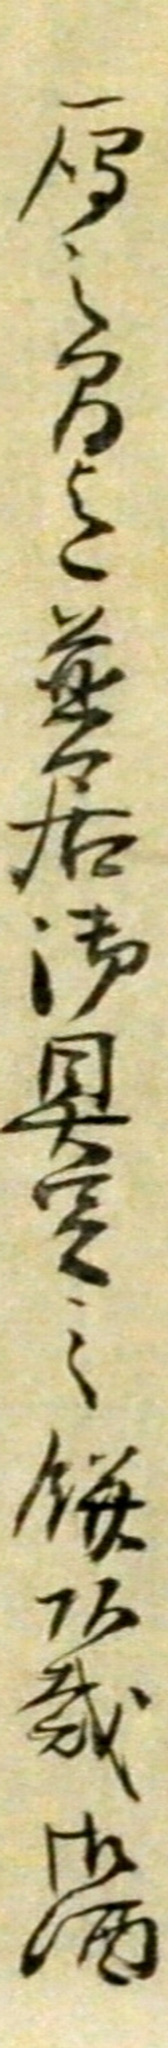雁之間迄並居御具足之餅頂戴御酒
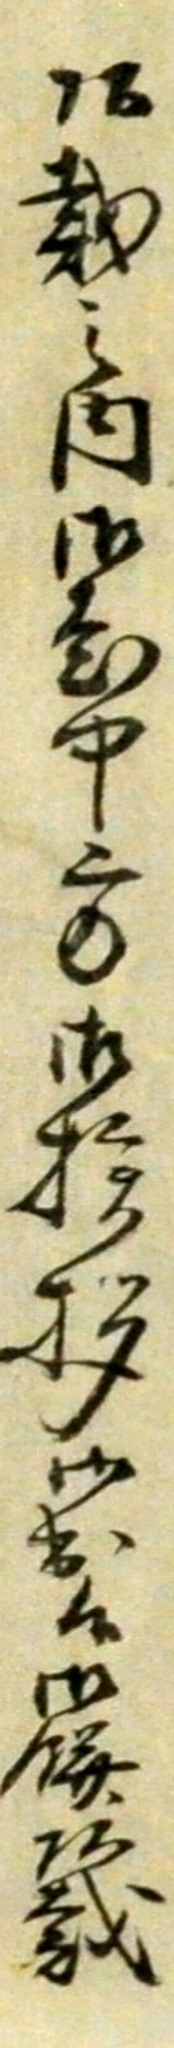頂戴之内御老中方御挨拶御出候御餅頂戴
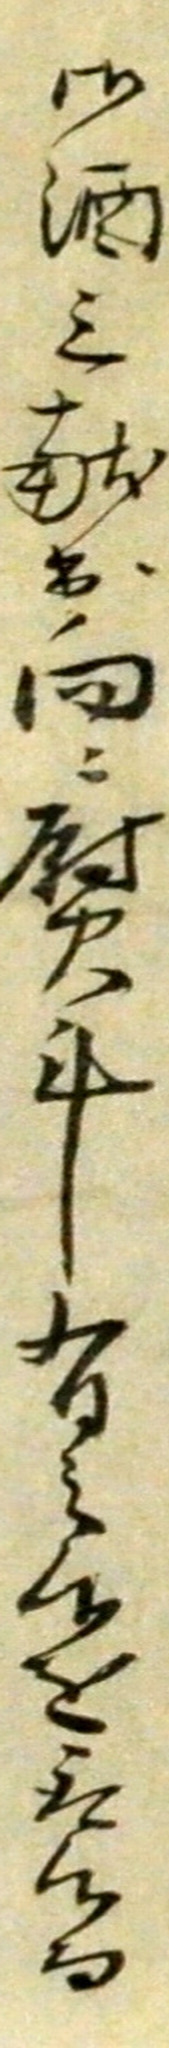御酒三献出向に熨斗有之候を取候て
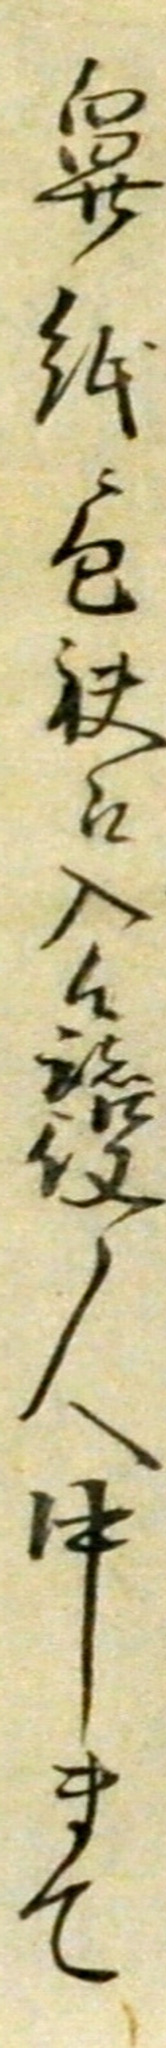鼻紙に包袂え入候諸役人中まて
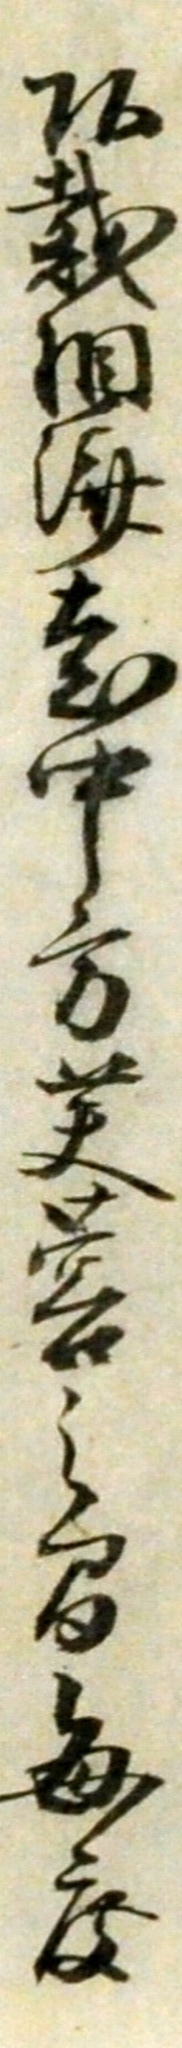頂戴相済老中方芙蓉之間毎度
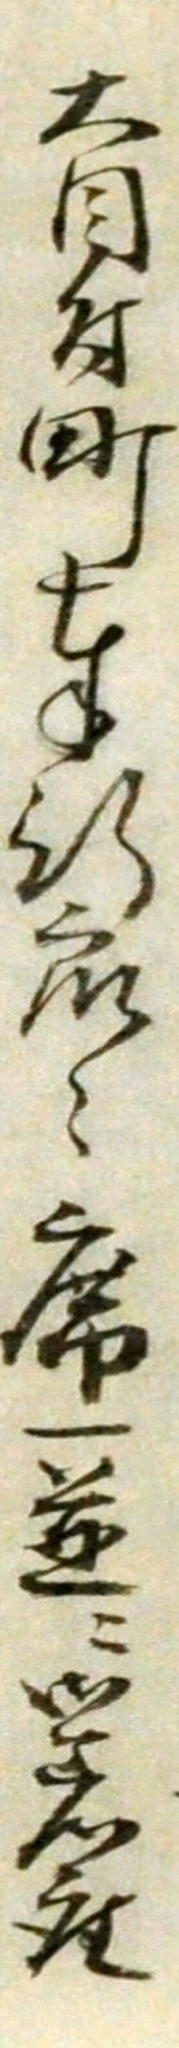大目付町奉行衆之席一並に御着座
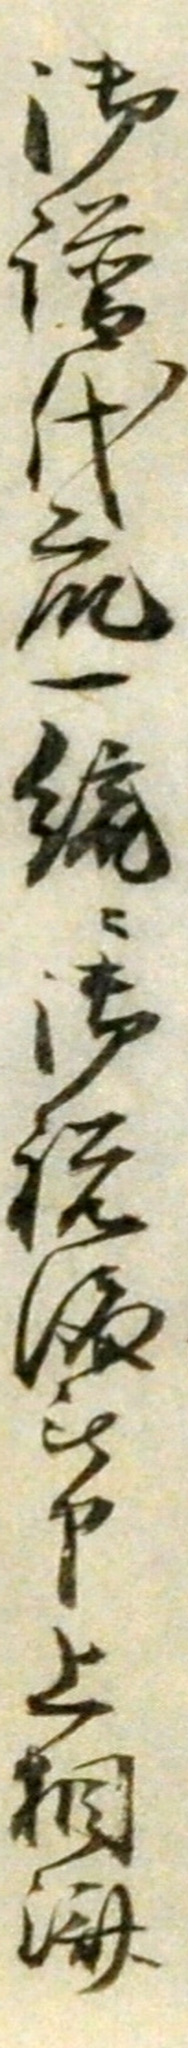御譜代衆一統に御祝儀被申上相済
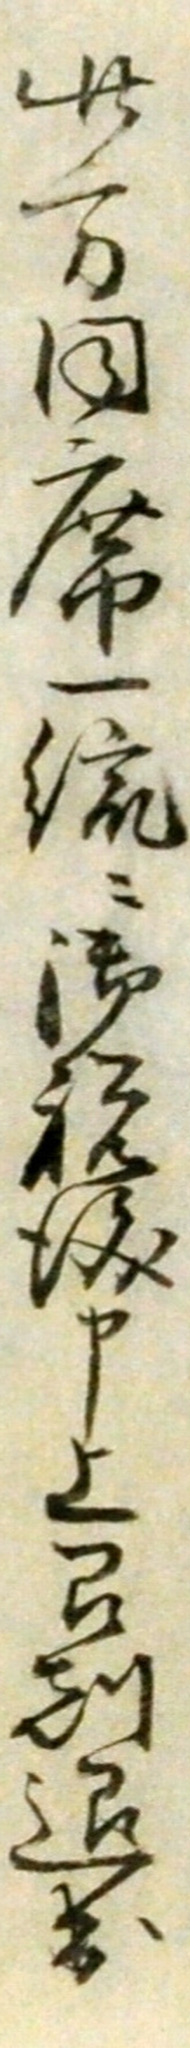此方同席一統に御祝儀申上即刻退出
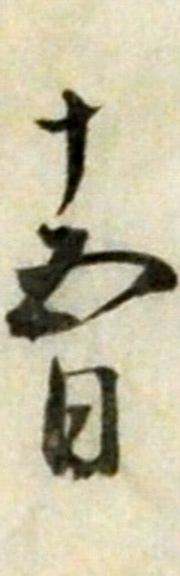十五日
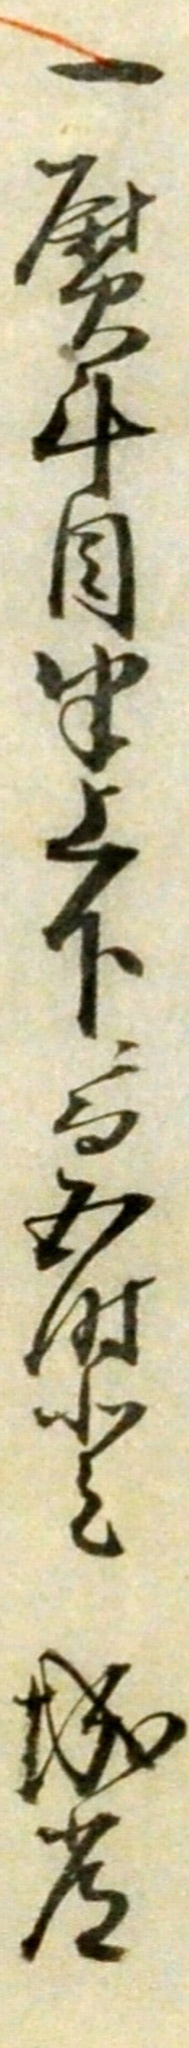一熨斗目半上下にて五時登城常
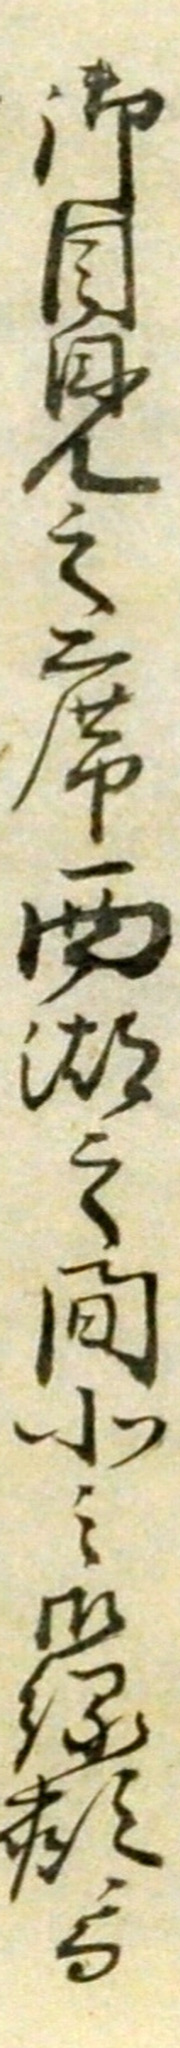御目見之席西湖之間北之御縁頬にて
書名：申合帳〔一括〕
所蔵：伊那市立高遠町図書館・合同会社AMANE
